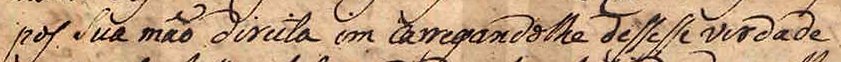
pos sua maõ direita imcarregandolhe dessesse verdade
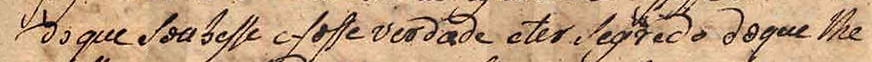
do que soubesse e fosse verdade e ter segredo do que lhe
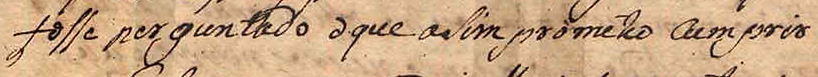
fosse perguntado o que asim prometeo cumprir
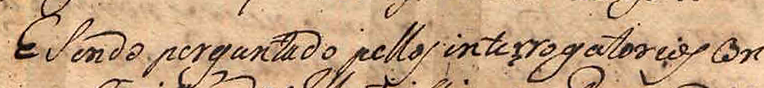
E Sendo perguntado pellos interrogatorios con
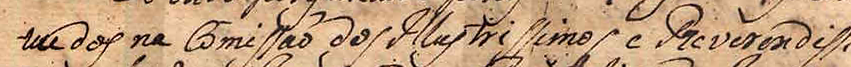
teudos na Cōmissaõ dos Illustrissimos e Reverendissi
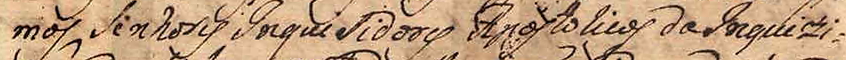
mos Senhores Inquisidores Apostolicos da Inquizi
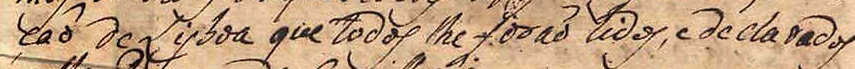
çaõ de Lisboa que todos lhe foraõ lidos, e declarados
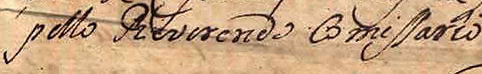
pello Reverendo Comissario
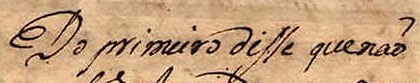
Do primeiro disse que naõ
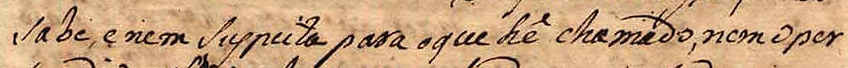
sabe, e nem suspeita para o que hé chamado, nem o per
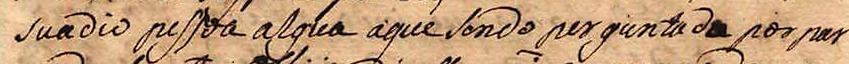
suadio pessoa algua a que sendo perguntado por par
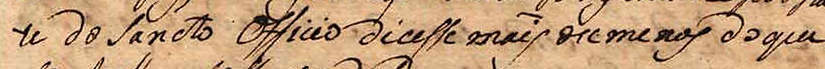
te do Sancto Officio dicesse mais ou menos do que
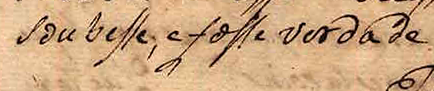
soubesse, e fosse verdade
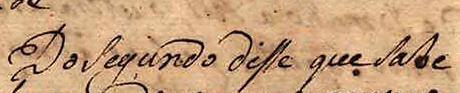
Do segundo disse que sabe
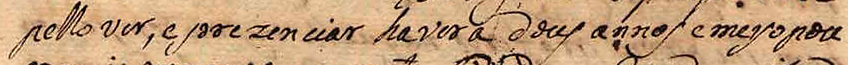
pello ver, e prezenciar havera dous annos e meyo pou
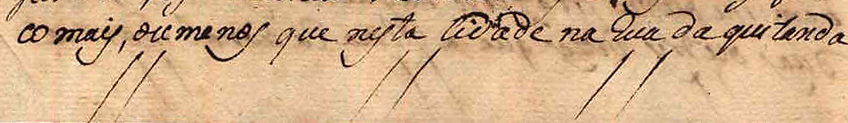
co mais, ou menos que nesta Cidade na Rua da quitanda
